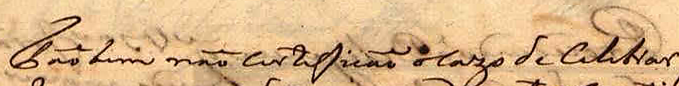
Taõbem naõ certeficaõ o cazo de Celebrar
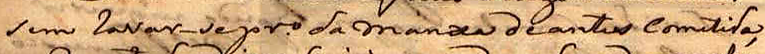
sem lavar-se pr.o da manxa de antes cometida,
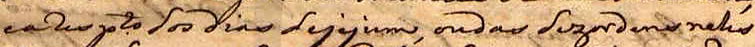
e a Respto dos dias de jejum, ou das dezordens neles
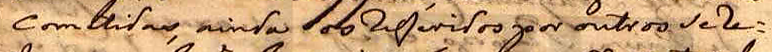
cometidas, ainda os Referidos por outros se Re
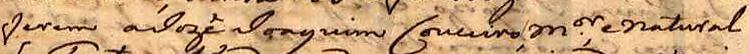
ferem a Iozé Ioaquim Couceiro, m.or, e natural
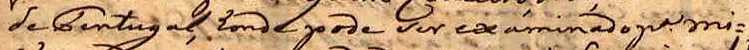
de Tentugal, honde pode ser examinado p.a mi
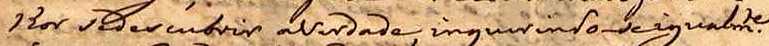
lhor se descubrir a verdade inquirindo- se igualm.te
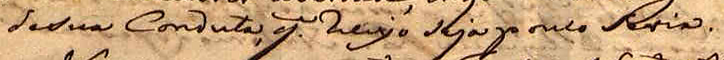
de sua Conduta, q̄ Receyo seja pouco seria.
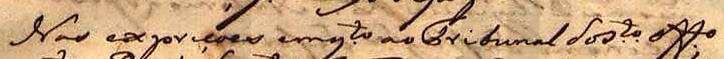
Nas expriçoes emq.to ao Tribunal do S.to off.o
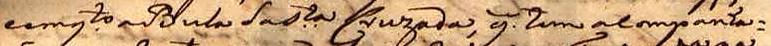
e em q.to a Bula da S.ta Cruzada, q̄ tem acompanha
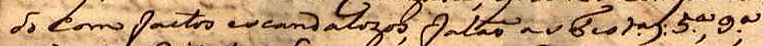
do Como factos escandalozos, falaõ as Tes.tas. 5.a, 9.a
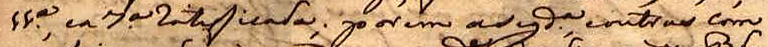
11.a, e a 7.a Rateficada; porem a segd.a e outras com
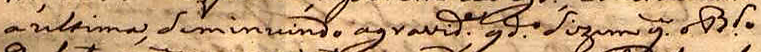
a ultima deminuindo a gravid.e qd.o dizem q̄ o R.do
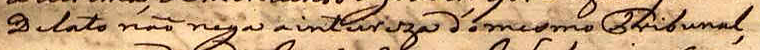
Delato naõ nega a inteireza do mesmo Tribunal,
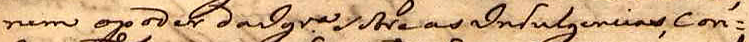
nem o poder da Igr.a sobre as Indulgencias, con
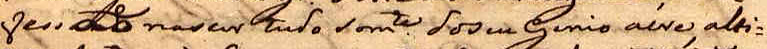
fessaõ nascer tudo som.te do seu Genio acre, alti
